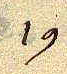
19
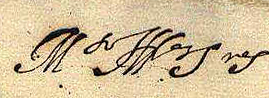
Mto Ill.es Sres
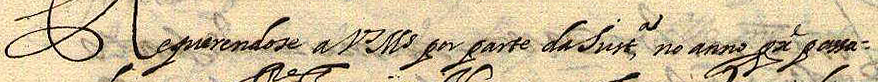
Requerendose a Vs Ms por parte da Iusta, no anno ꝓxe passa
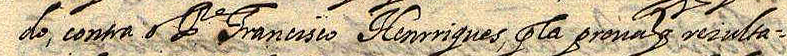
do, contra o Pe Francisco Henrriques, pla proua q̄ rezulta
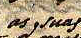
as suas
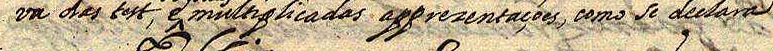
va das test, e multiplicadas apprezentações, como se declara
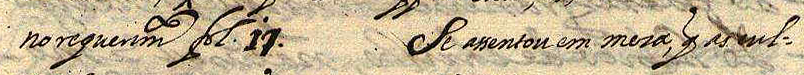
no requerimto fol. 17. Se assentou em meza, q̄ as cul
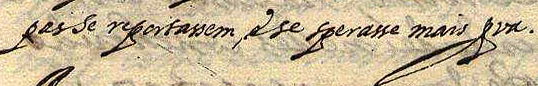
pas se reportassem, e se sperasse mais ꝓva.
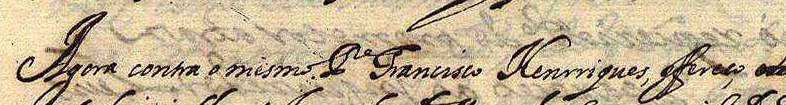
Agora contra o mesmo Pe Francisco Henrriques, offereço
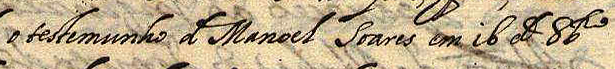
o testemunho d̄ Manoel Soares em 16 d̄ 8bro
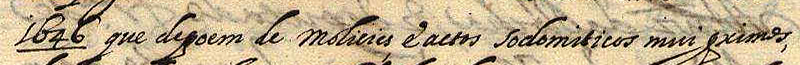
1646 que depoem de molicies, e actos sodomiticos mui ꝓximos,
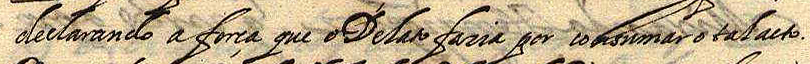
declarando a força que o Delato fazia por consumar o tal acto.
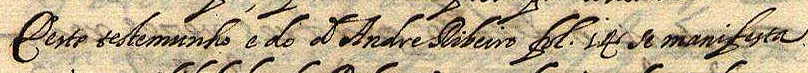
Deste testemunho e do d̄ Andre Ribeiro fol. 14 se manifesta
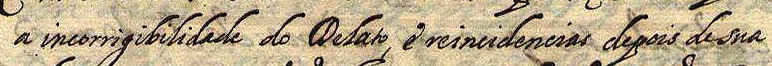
a incorrigibilidade do Delato, e reincidencias depois de sua
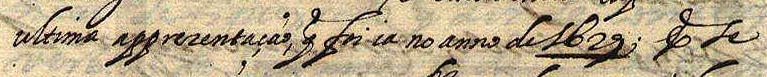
ultima apprezentaçaõ, q̄ foi ia no anno de 1629, E se
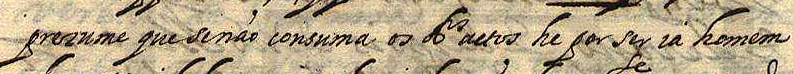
prezume que se não consuma os dos actos he por ser ia homem
